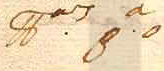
Tt.as p.a o
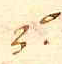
3.o
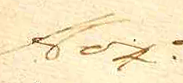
Ao 4.o
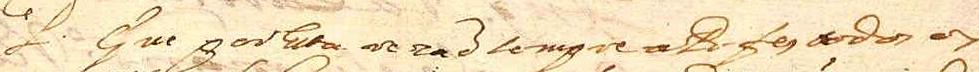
P. Que por Esta rezaõ sempre a R fes todos os
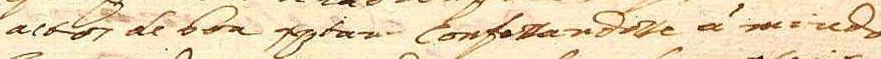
actos de boa xptam confessandosse á miudo
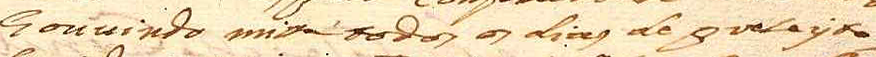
E ouuindo missa todos os dias de preceyto
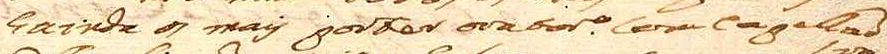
E ainda os mais por ter orator.o com capellaõ
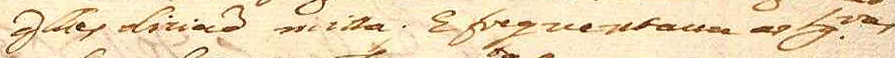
q̄ lhes diziaõ missa. E frequentaua as Ig.ras
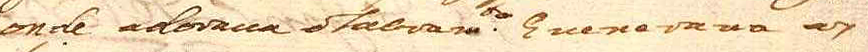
onde adoraua o sacram.to E ueneraua as
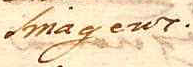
Imagens.
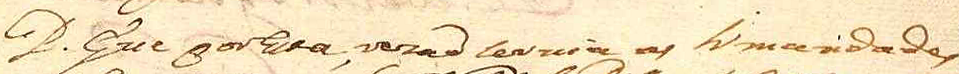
P. Que por Esta rezaõ seruia as Irmandades
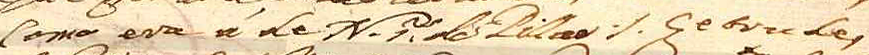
Como era á de N. sra do Pillar .s. Getrudes
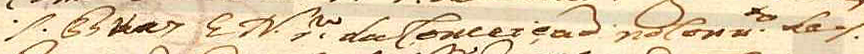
.s. Bras E N. s.ra da Conceiçaõ no Conu.to de .s.
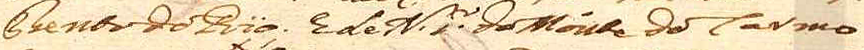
Bento do Rio, E de N. sra. do Monte do Carmo
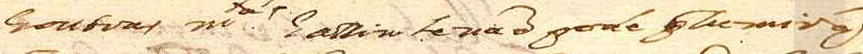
E outras mta.s E assim se naõ pode prezumir q̄
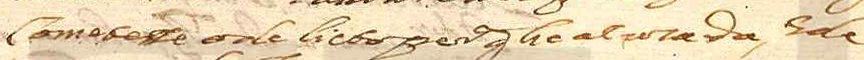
Cometesse o delicto per q̄ he acuzada, E de
